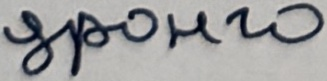дронго
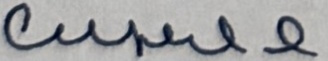синяя
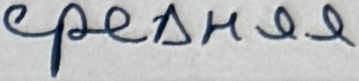средняя
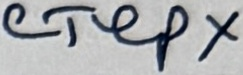стерх
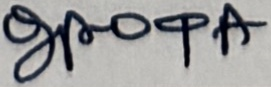дрофа
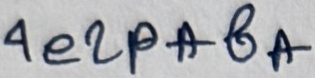чеграва
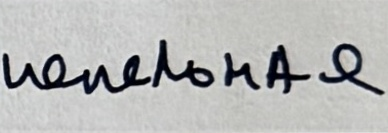пепельная
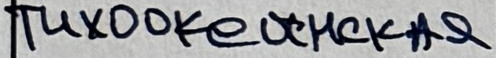тихоокеанская
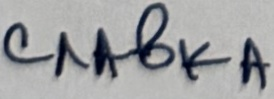славка
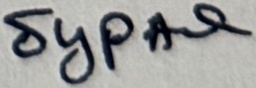бурая
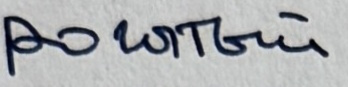рогатый
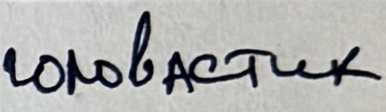головастик
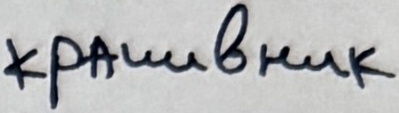крапивник
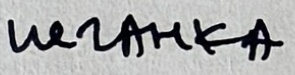пеганка
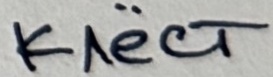клёст
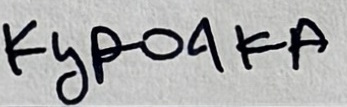курочка
